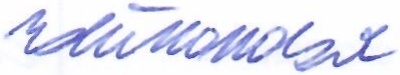чайконосая
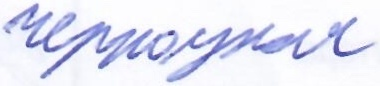черноухая
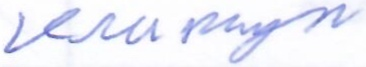клитуп
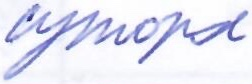сутора
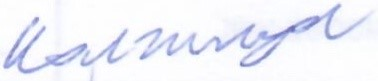колпица
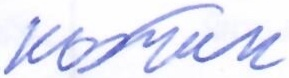кобчик
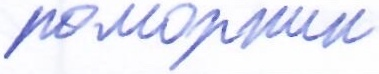поморник
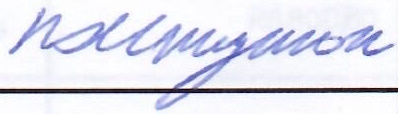пастушок
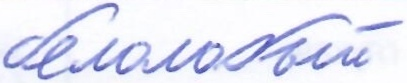белолобый
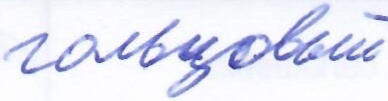гольцовый
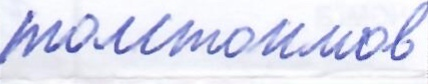толстоклюв
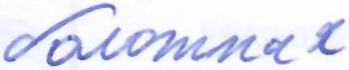болотпа я
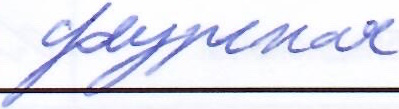даурская
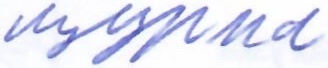щурпа
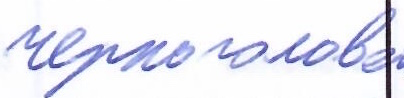черноголова
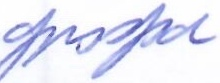дрофа
